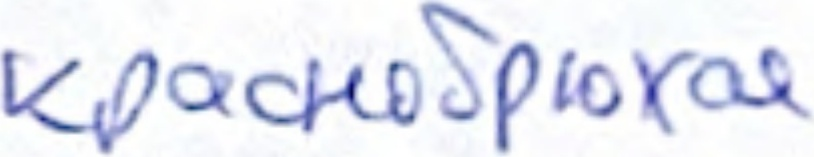краснобрюхая
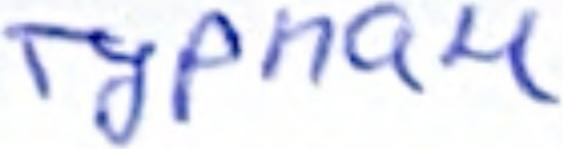турпан
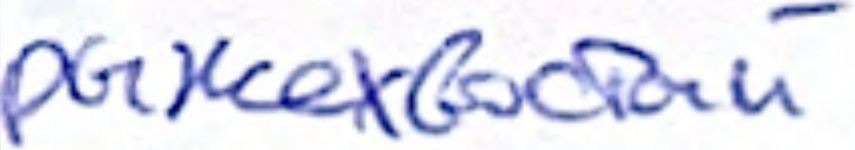рыжехвостый
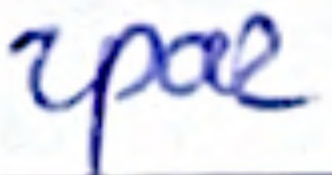грач
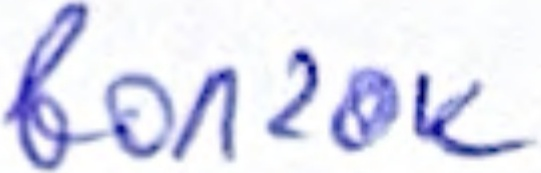волчок
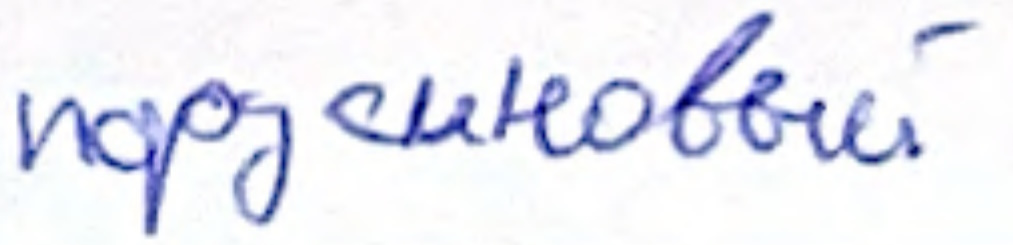пору синовый
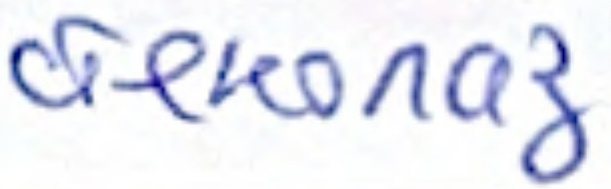стенолаз
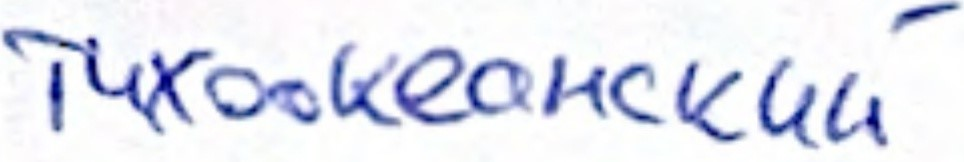тихоокеанский
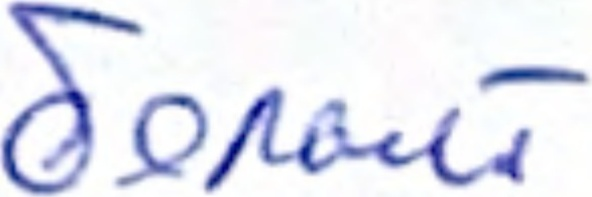белый
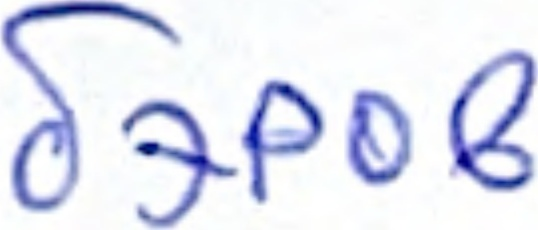бэров
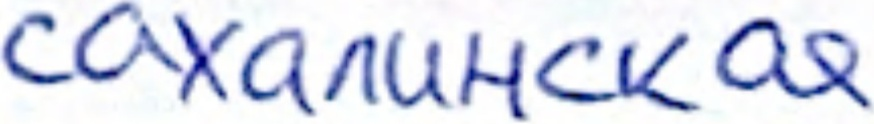сахалинская
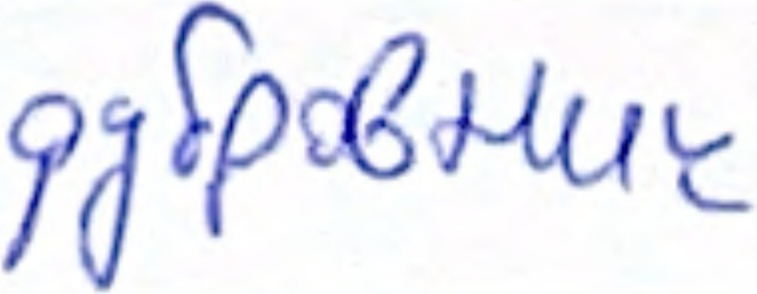дубровник
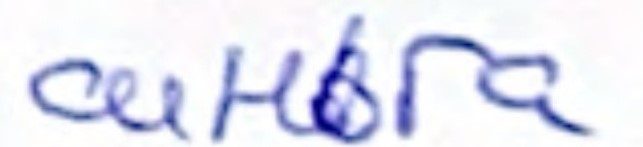синьга
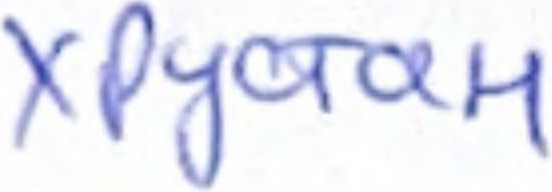хрустан
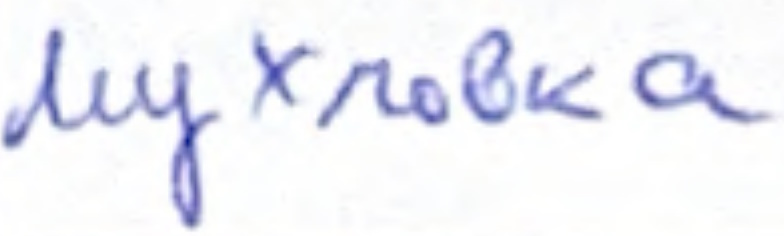мухловка
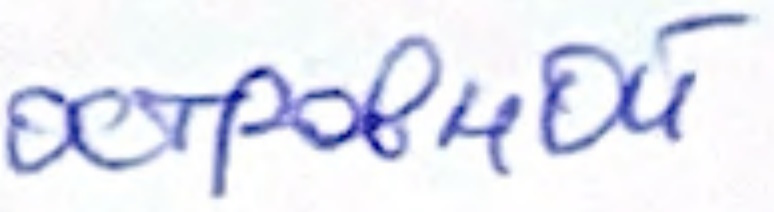островной
